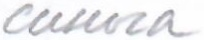синьга
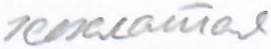хохлатая
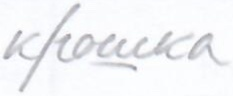крошка
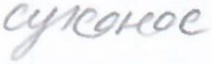сухонос
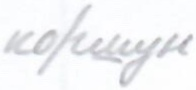коршун
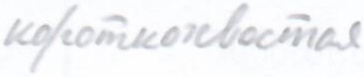короткохвостая
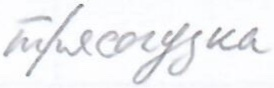трясогузка
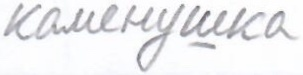каменушка
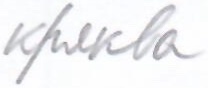кряква
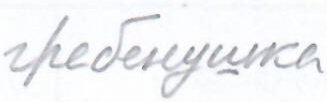гребенушка
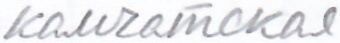камчатская
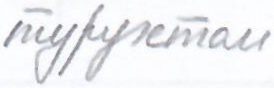турухтан
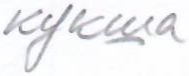кукша
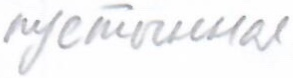пустынная
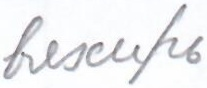вяхирь
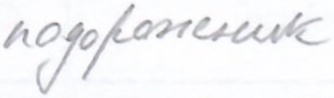подорожник
